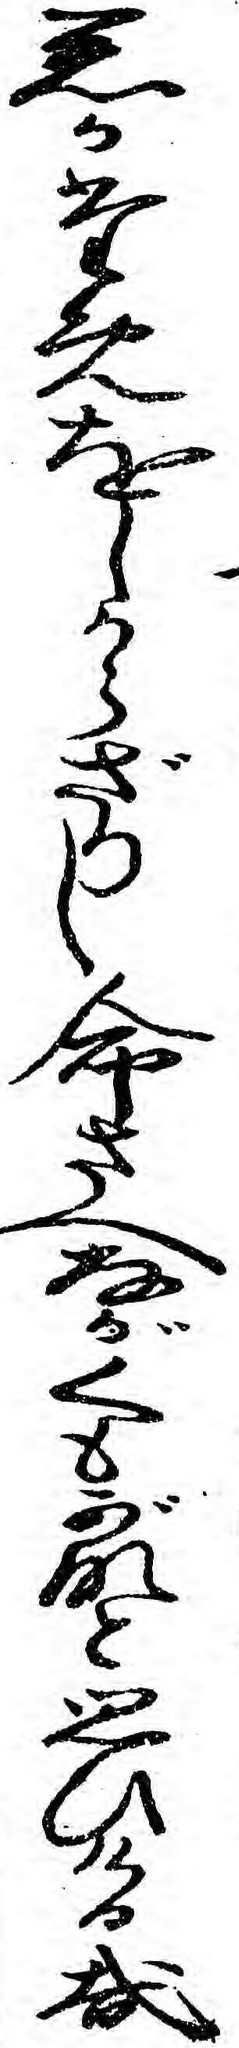君がためをしからざりし命さへながくもがなと思ひける哉
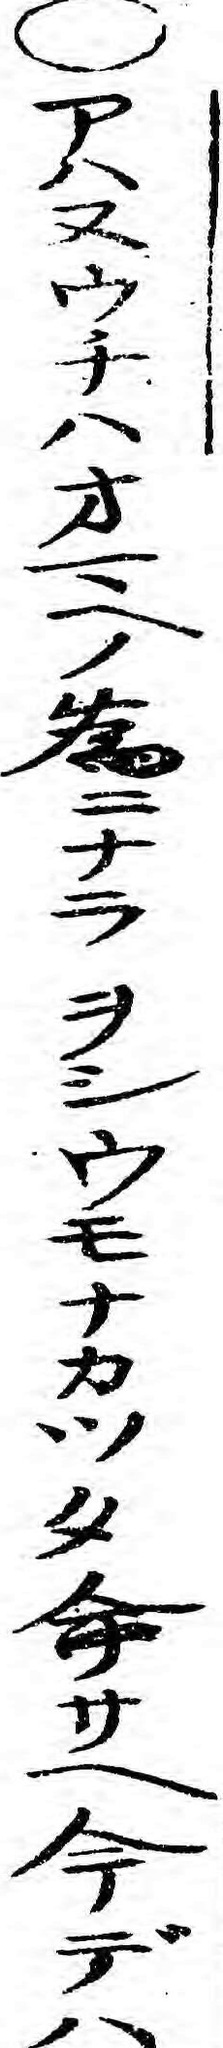○アハヌウチハオマヘノ為ニナラヲシウモナカツタ命サヘ今デハ
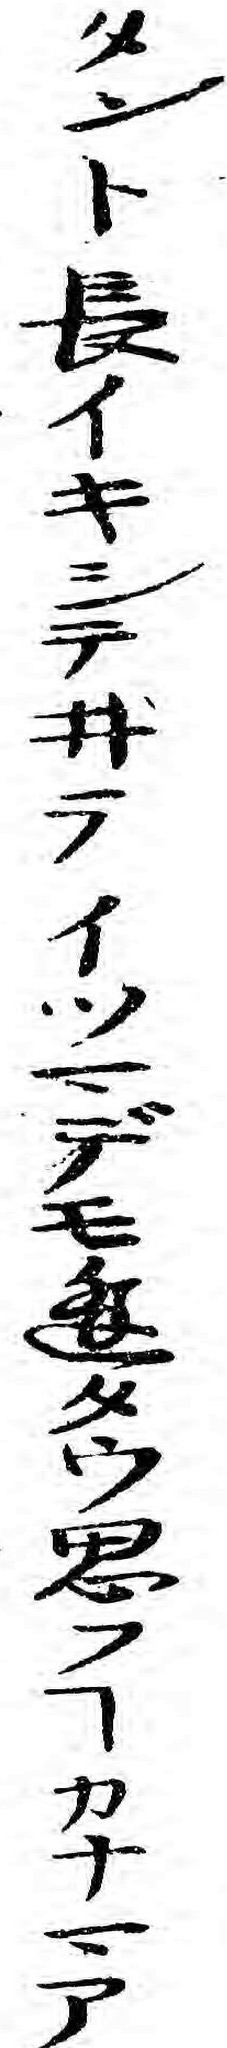タント長イキシテヰテイツマデモ逢タウ思フコトカナマア
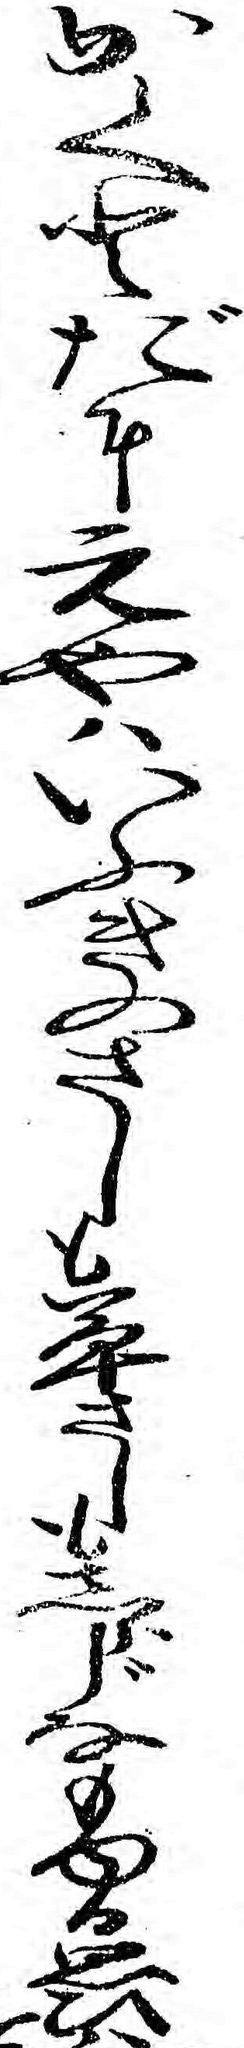かくとだにえやはいぶきのさしも草さしもしらじなもゆる思ひを
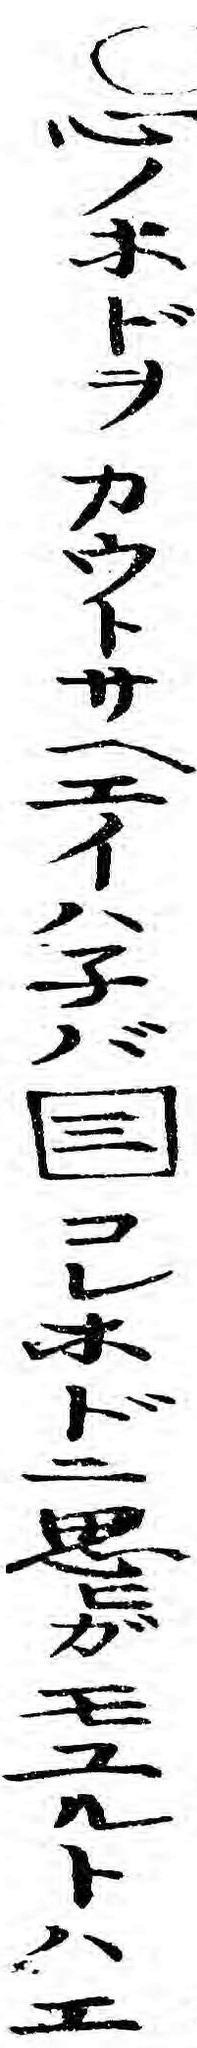○心ノホドヲカウトサヘエイハネバ三コレホドニ思ヒガモユルトハエ
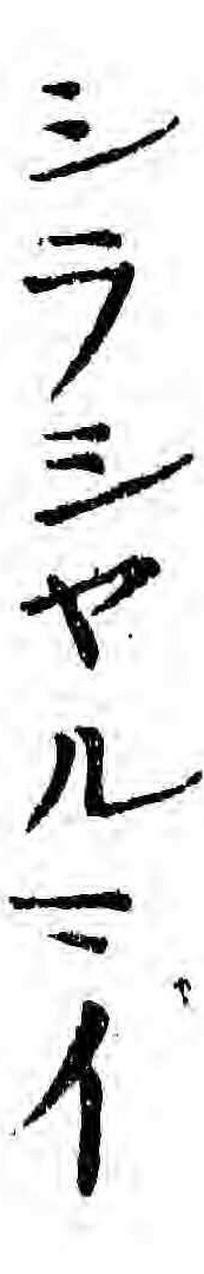シラシヤルマイ
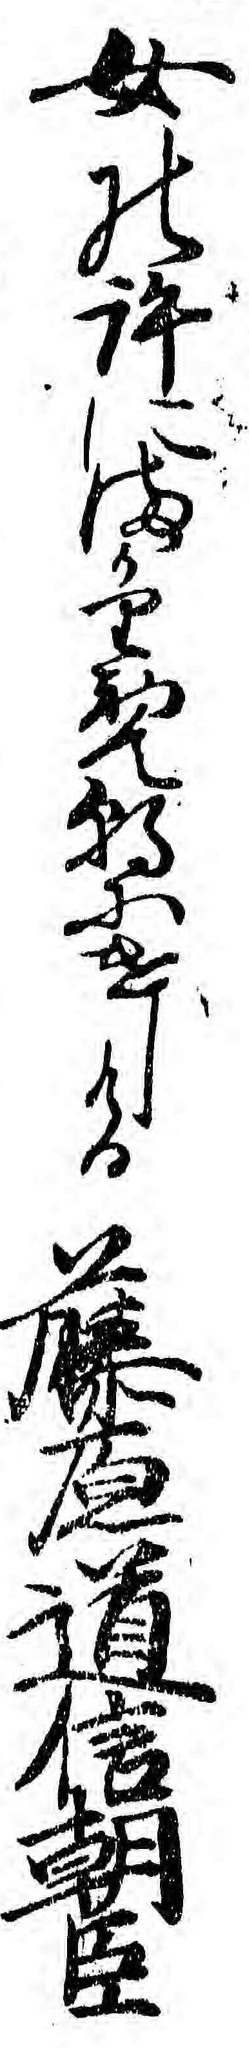家集女の許にまかり初て朝に遣しける藤原道信朝臣
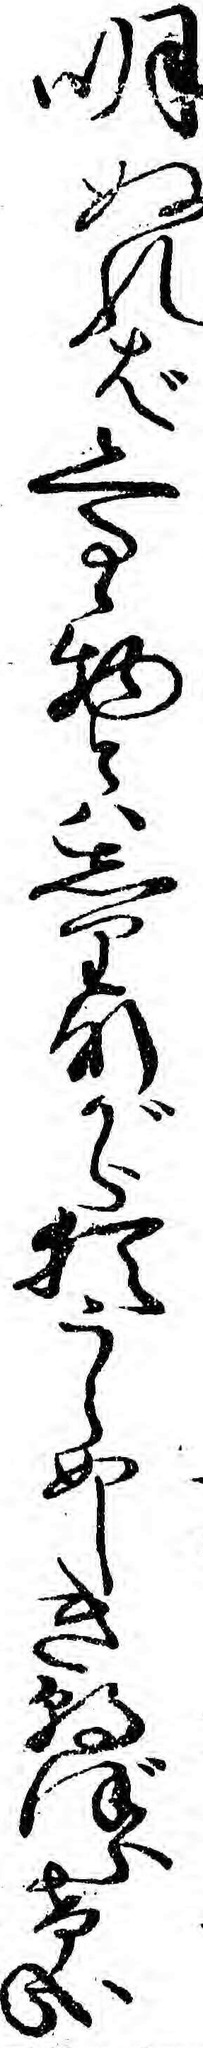明ぬればくるゝものとはしりながら猶うらめしき朝ぼらけ哉
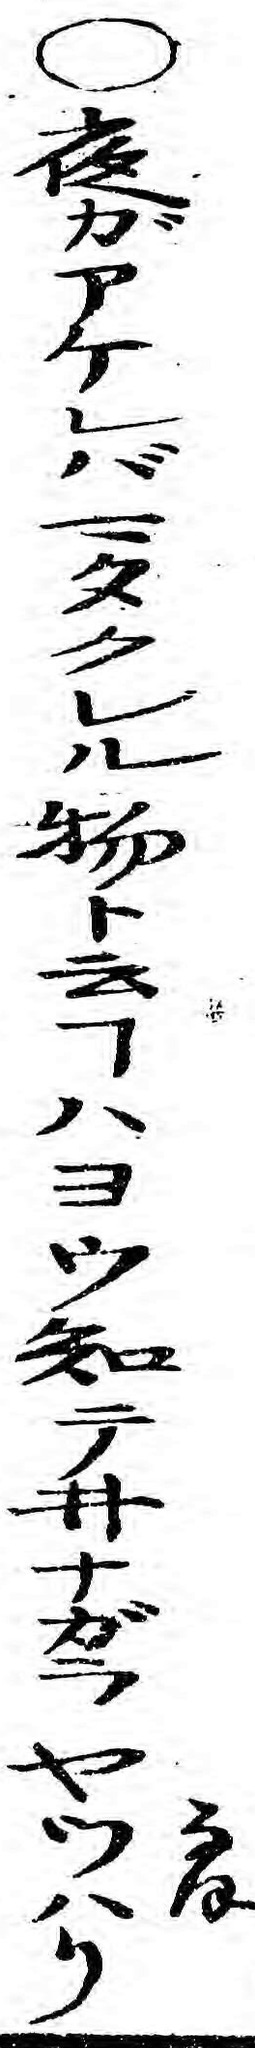○夜ガアケレバマタクレル物ト云コトハヨウ知テヰナガラヤツハリ
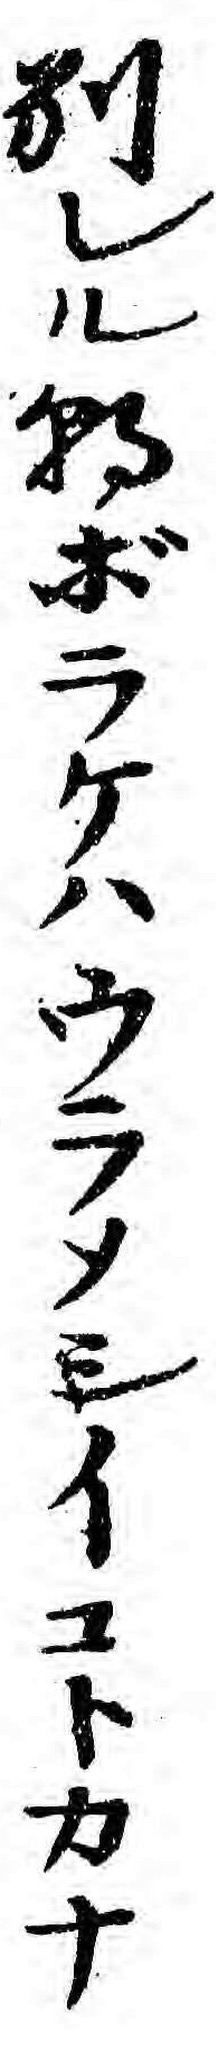別レル朝ボラケハウラメシイコトカナ

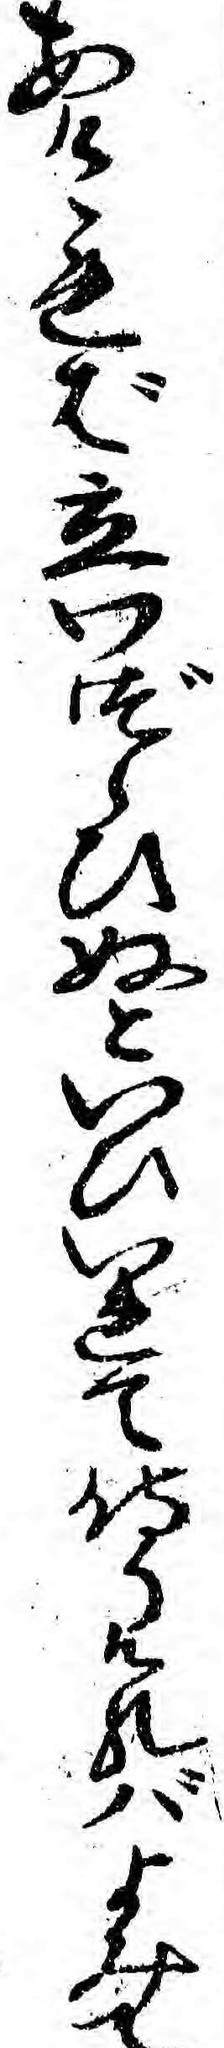あけゝれば立わづらひぬといひいれて侍りければよみて
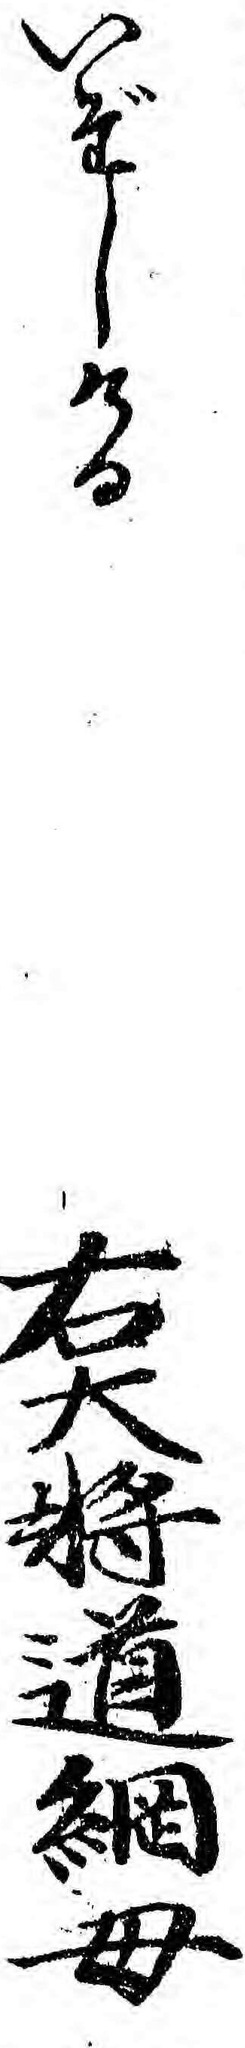いだしける右大将道綱母
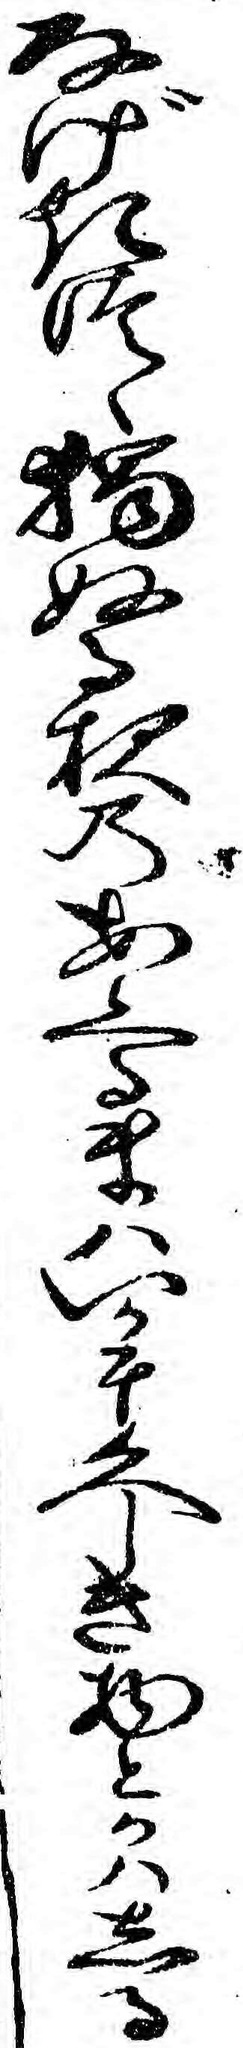なげきつゝ独ぬる夜のあくるまはいかに久しき物とかはしる
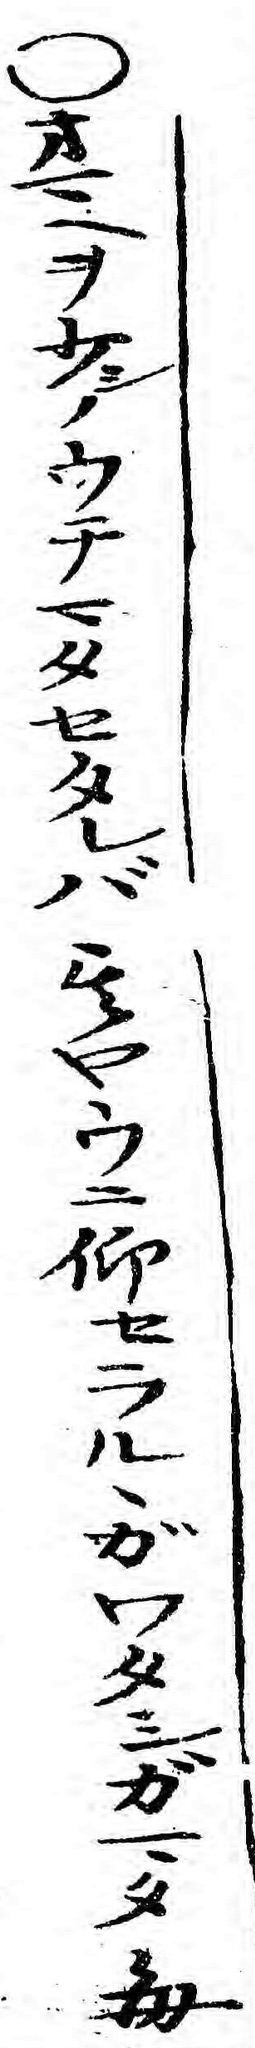○オマヘヲ少シノウチマタセタレバ其ヤウニ仰セラルヽガワタシガマタ毎
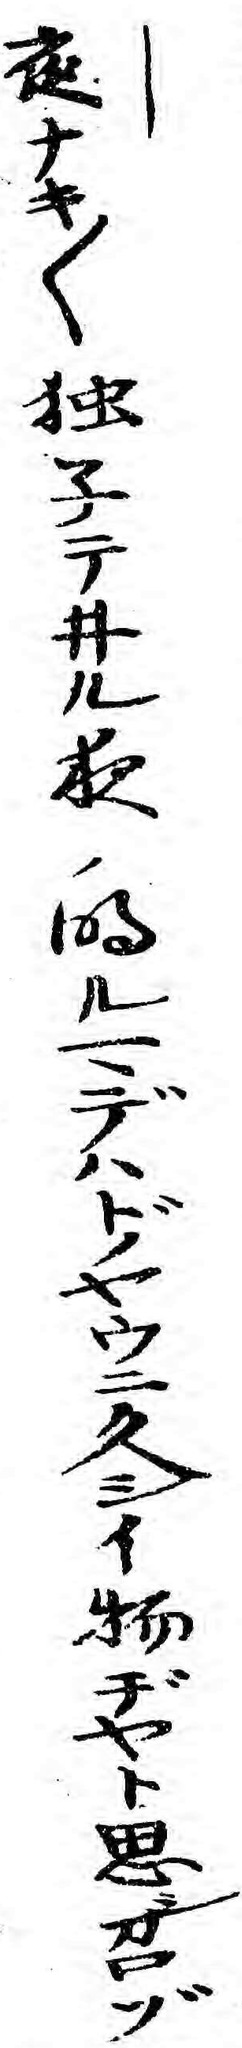夜ナキ〳〵独ネテヰル夜ノ明ルマデハドノヤウニ久シイ物ヂヤト思シカロゾ
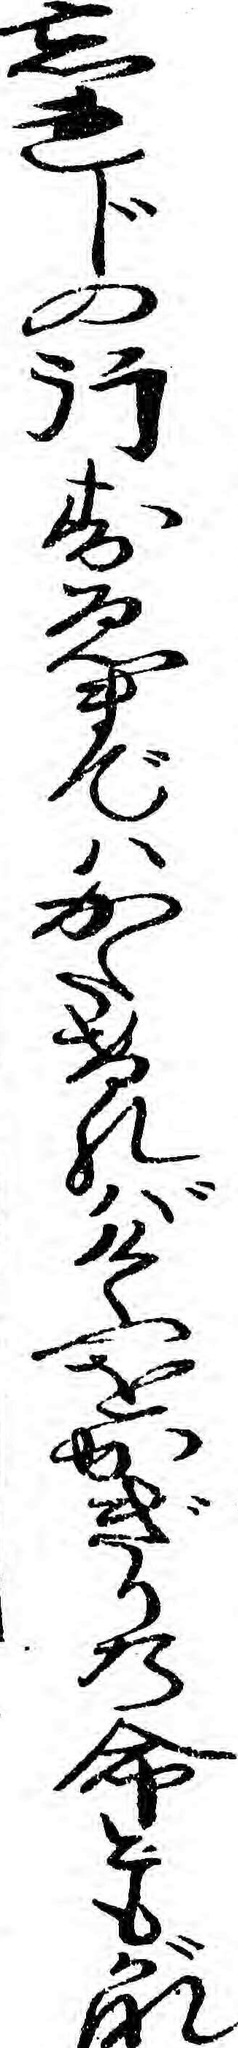忘れじの行すゑまではかたければけふをかぎりの命ともがな
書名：百人一首／小倉の山ふみ
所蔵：国文学研究資料館
